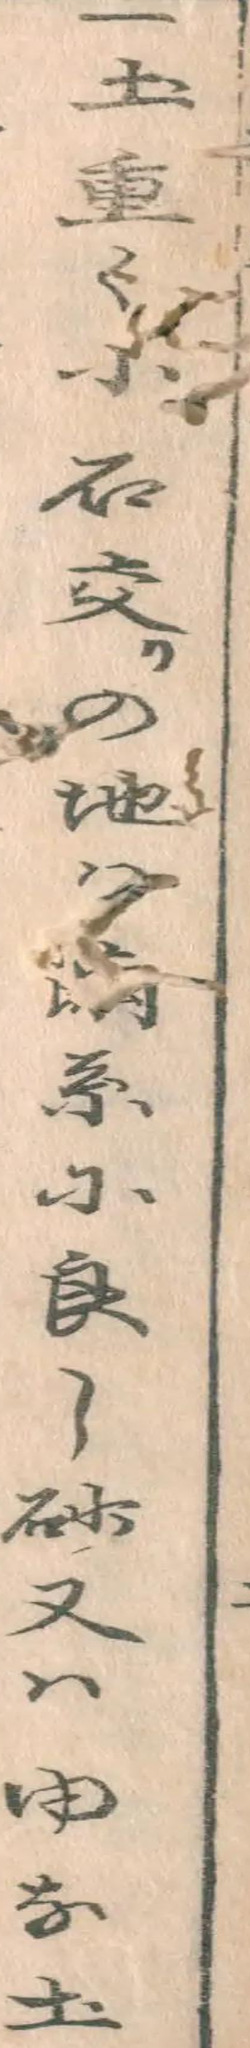一土重く小石交りの地は繭糸に良し砂又はゆな土
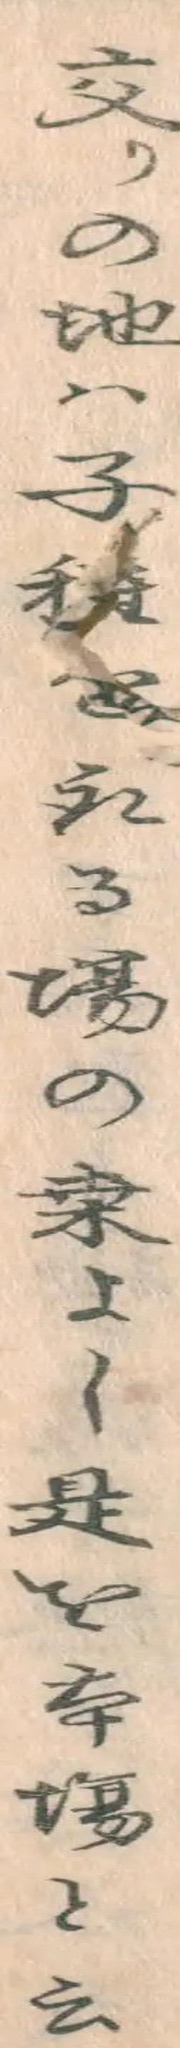交りの地は子種を取る場の桑よし是を本場と云
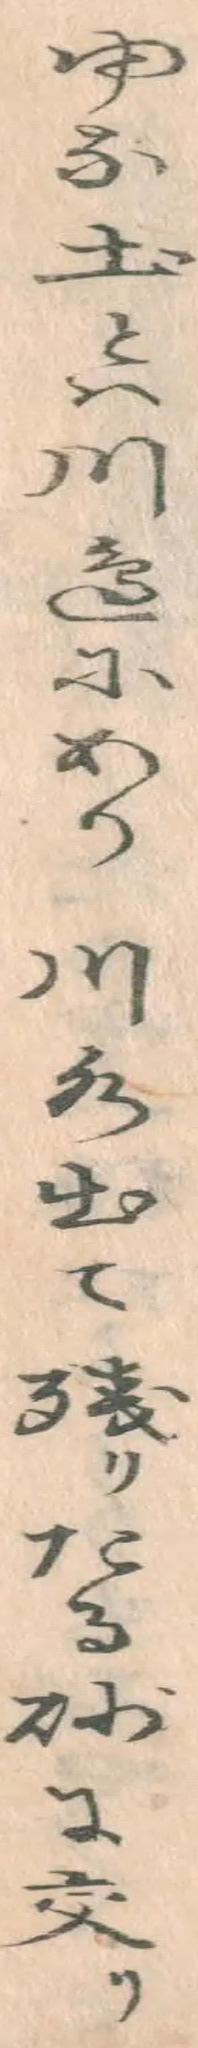ゆな土とは川辺にあり川水出て残りたる砂に交り
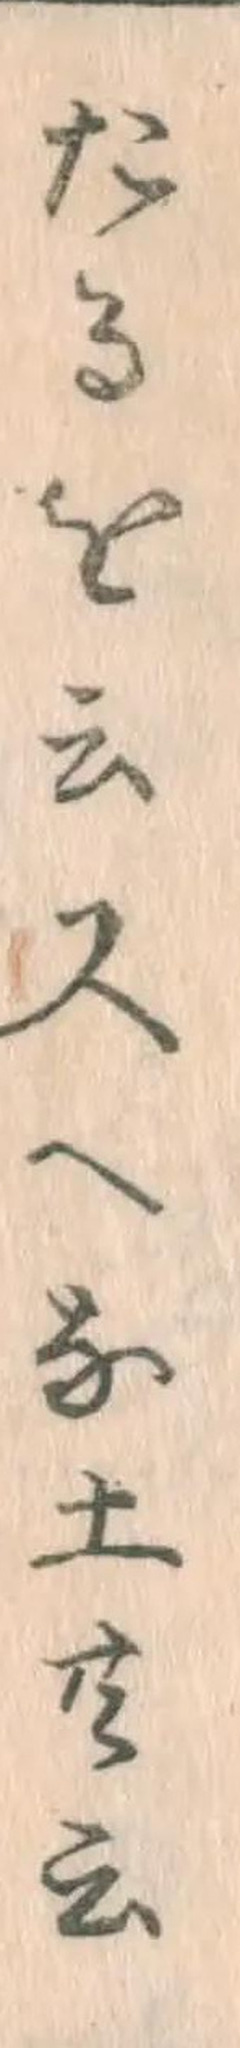たるを云又へな土共云
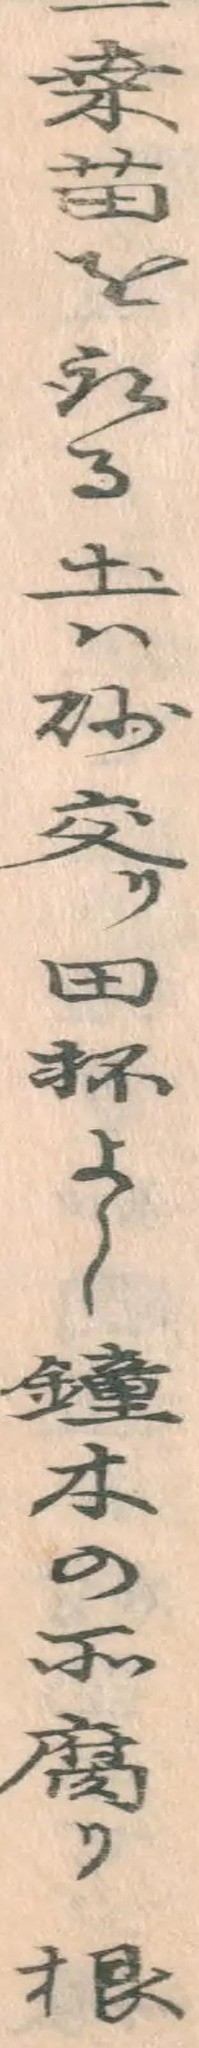一桑苗を取る土は砂交り田抔よし鐘木の所腐り根
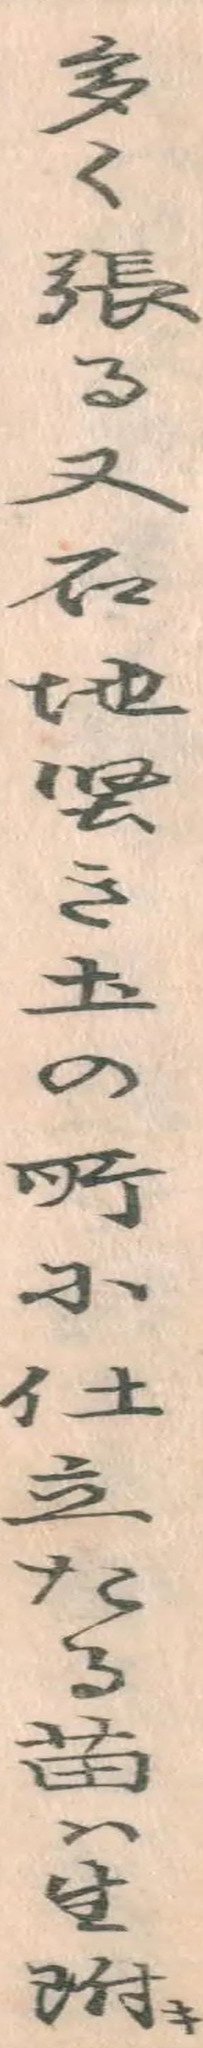多く張る又石地堅き土の所に仕立たる苗は生附き
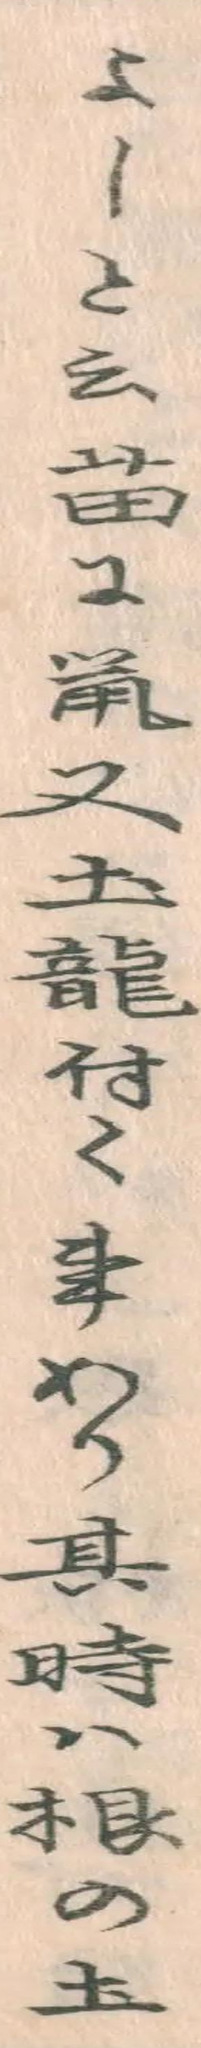よしと云苗に鼠又土龍付く事あり其時は根の土
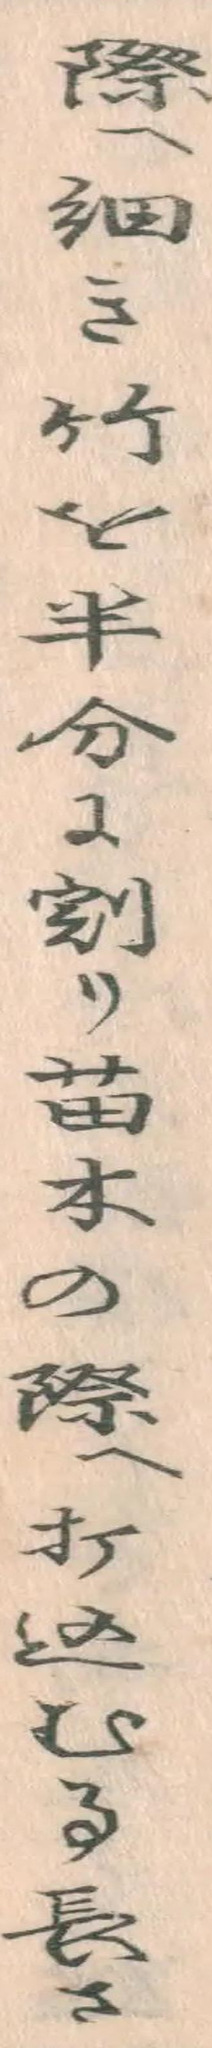際へ細き竹を半分に割り苗木の際へ打込む事長さ
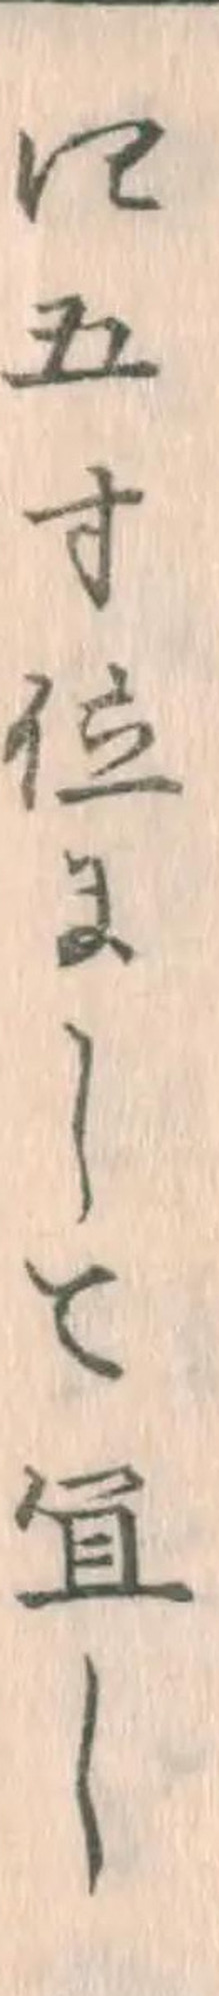四五寸位にして宜し
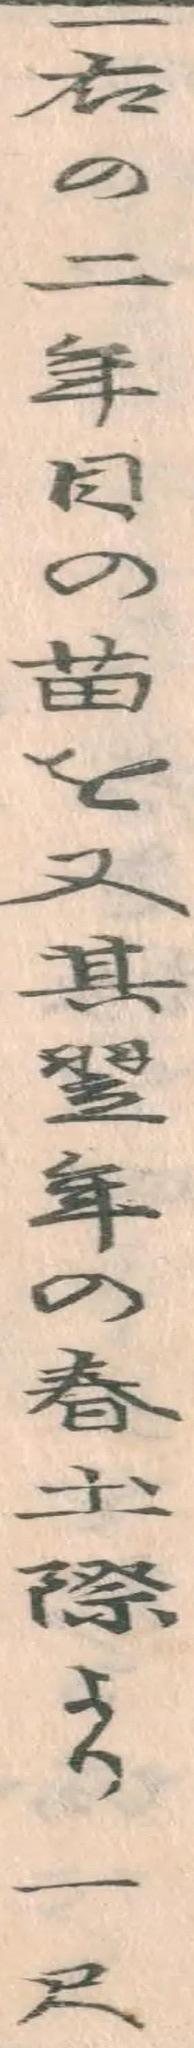一右の二年目の苗を又其翌年の春土際より一尺
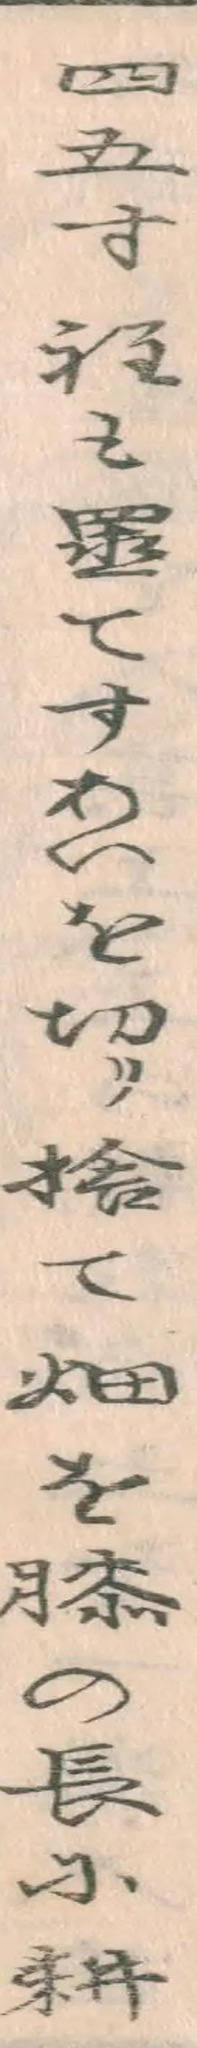四五寸程も置てすあいを切り捨て畑を膝の長に耕
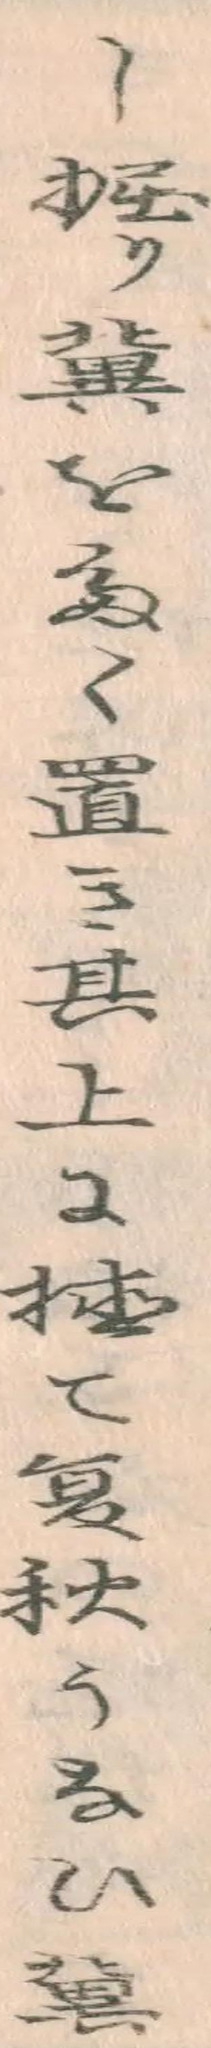し掘り冀を多く置き其上に植て夏秋うなひ冀
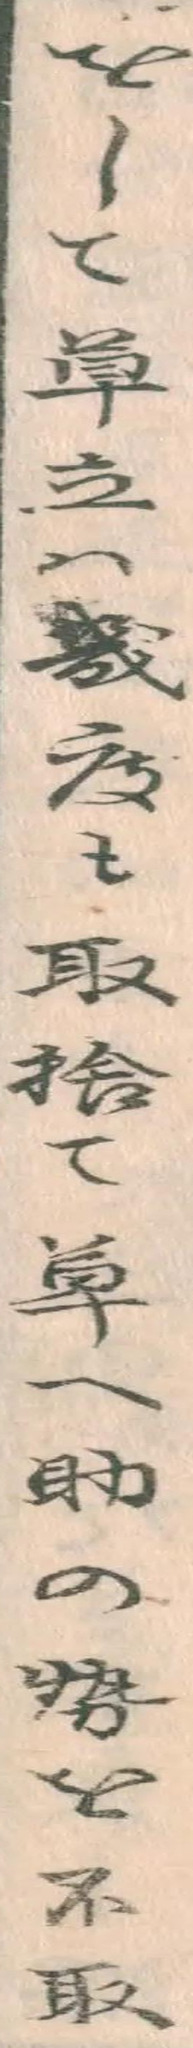をして草立は幾度も取捨て草へ助の勢を不取
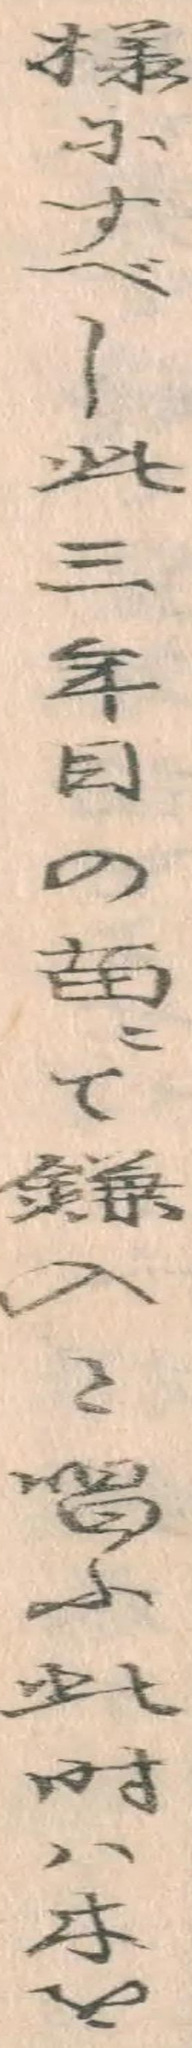様にすべし此三年目の苗にて鎌入と唱ふ此時は木を
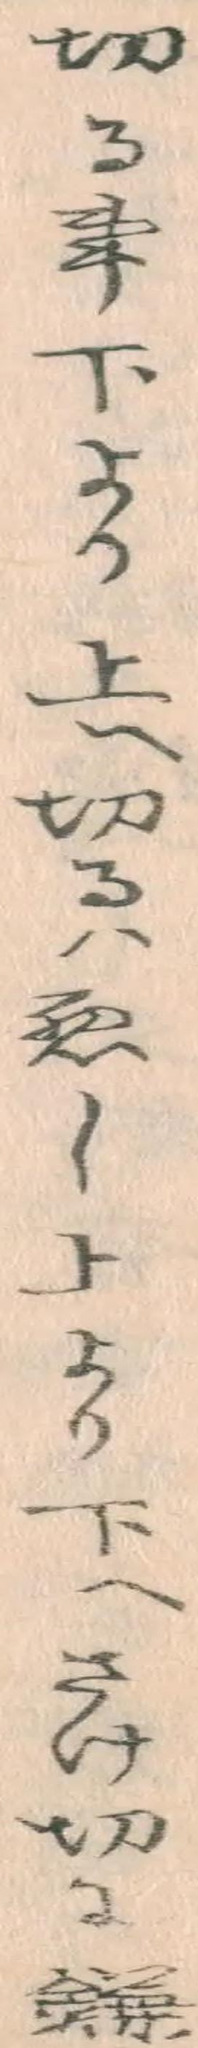切る事下より上へ切るは悪し上より下へさけ切に鎌
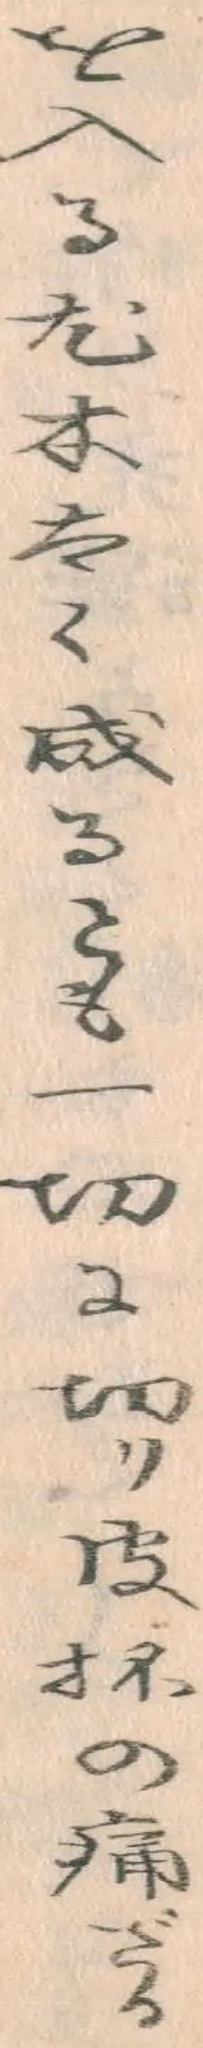を入る尤木太く成るとも一切に切り皮抔の痛ざる
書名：機織彙編 5巻. [1]
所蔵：国立国会図書館 National Diet Library, JAPAN
